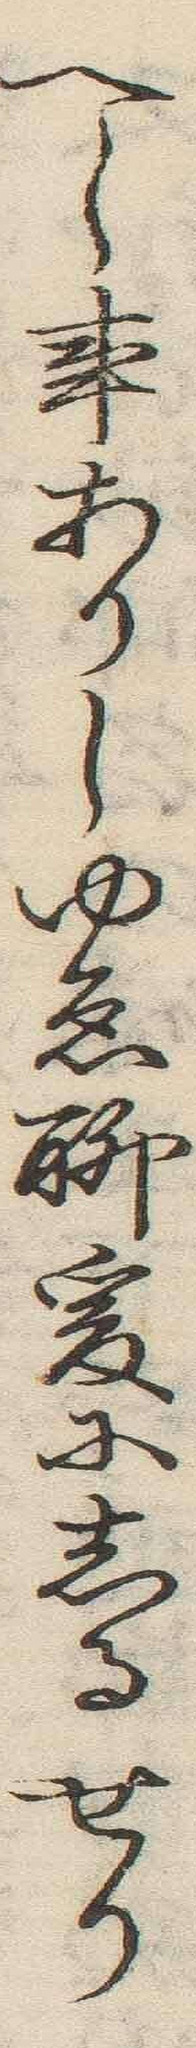へし事ありしゆゑ聊爰にしるせり
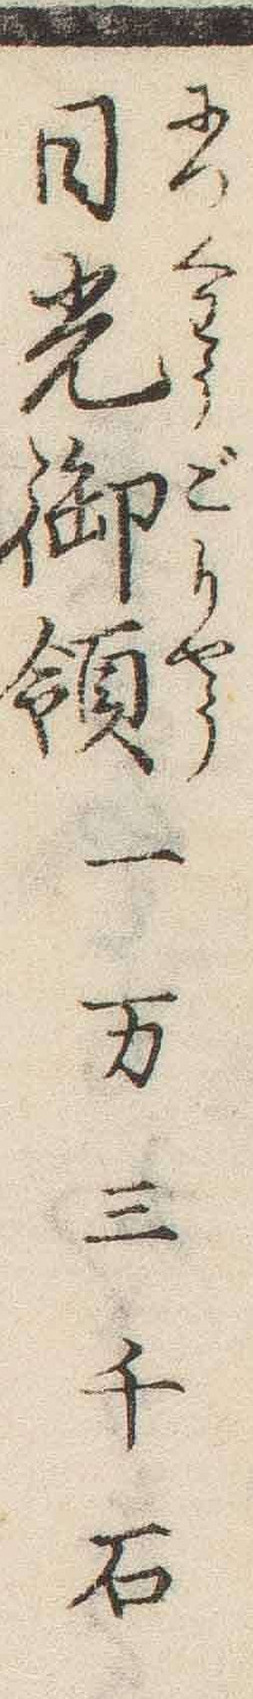日光御領一万三千石
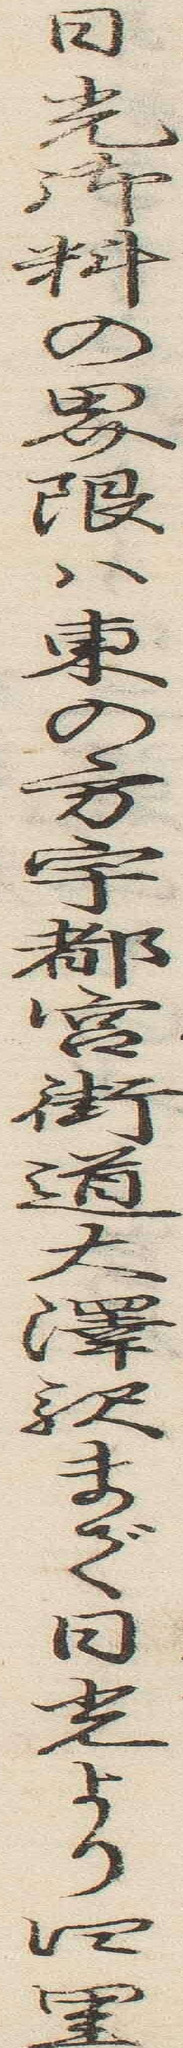日光御料の界限は東の方宇都宮街道大澤駅まで日光より四里
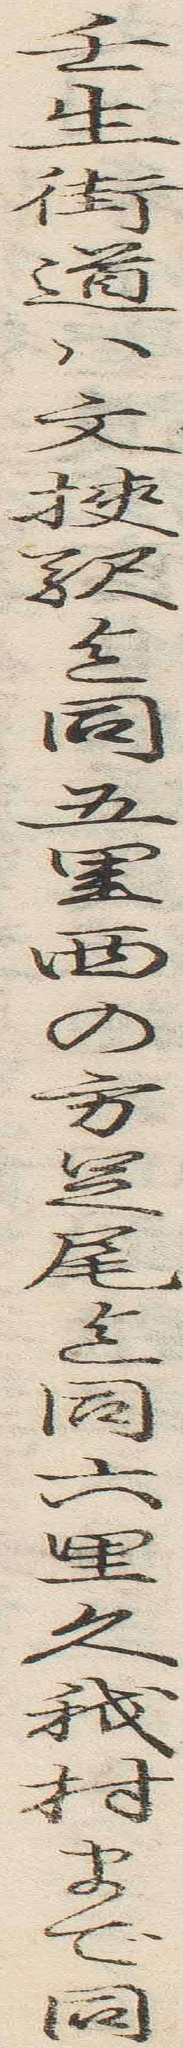壬生街道は文挾駅迠同五里西の方足尾迠同六里久我村まで同
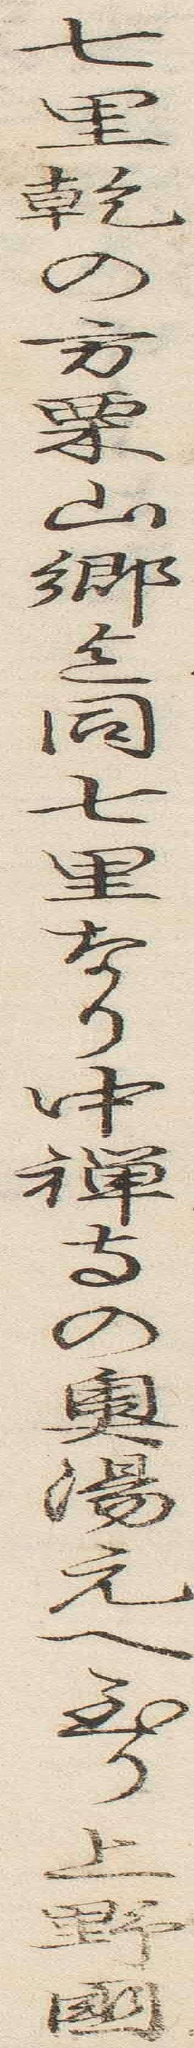七里乾の方栗山郷迠同七里なり中禅寺の奥湯本へ至り上野國
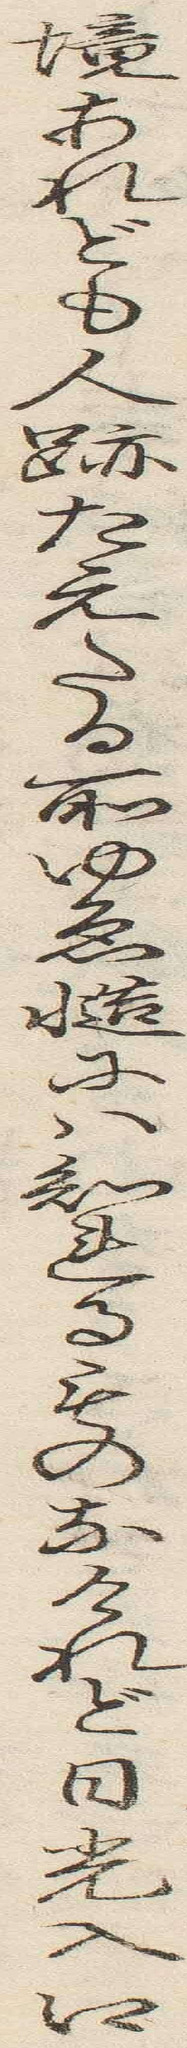境あれども人跡たえたる所ゆゑ慥には知れるものなけれど日光入口
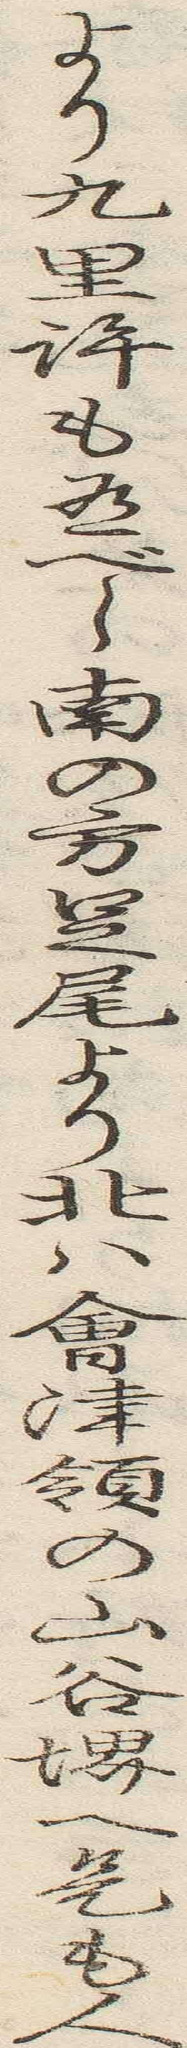より九里許も有べし南の方足尾より北は會津領の山谷堺へ是も人
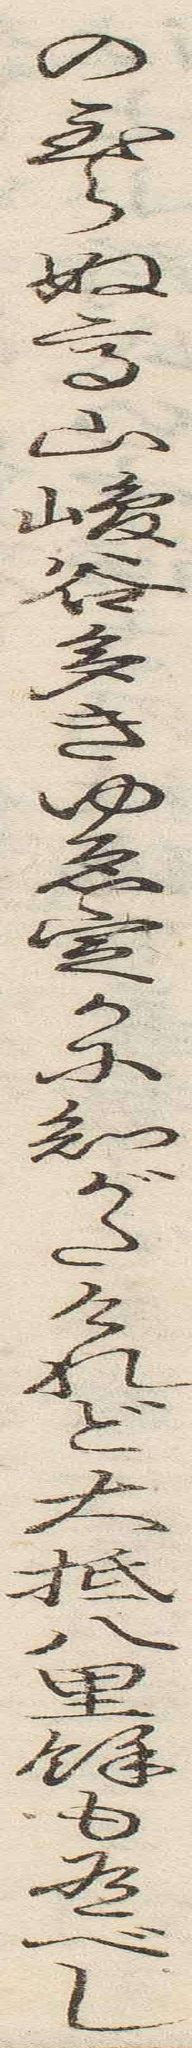の至らぬ高山峻谷多きゆゑ定かに知がたけれど大抵八里餘も有べし
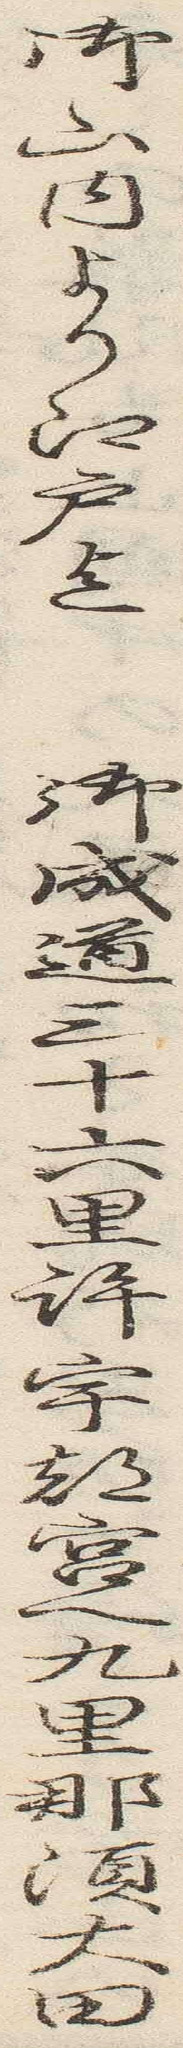御山内より江戸迠御成道三十六里許宇都宮へ九里那須大田
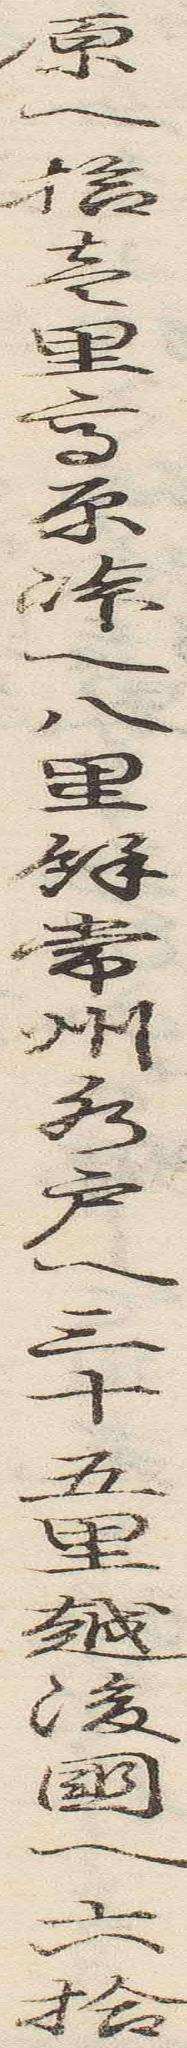原へ拾壱里高原峠へ八里餘常州水戸へ三十五里越後國へ六拾
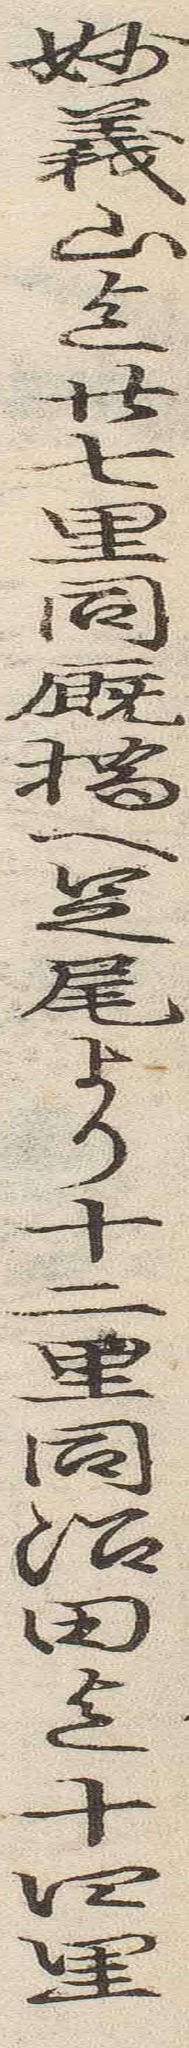妙義山迠廿七里同厩橋へ足尾より十二里同沼田迠十四里
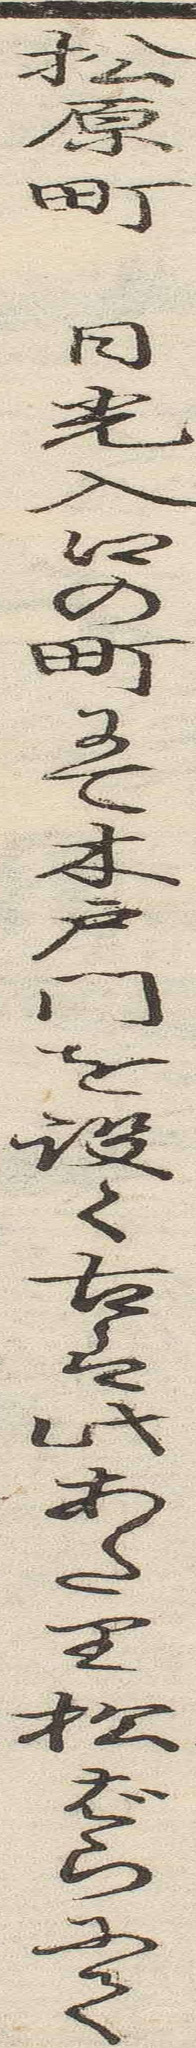松原町日光入口の町にて木戸門を設く古は此あたり松ばらにて
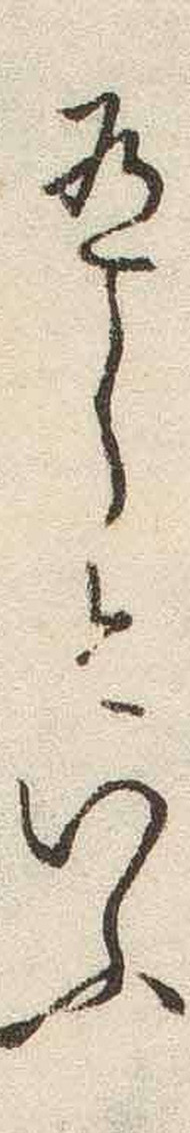有しといふ
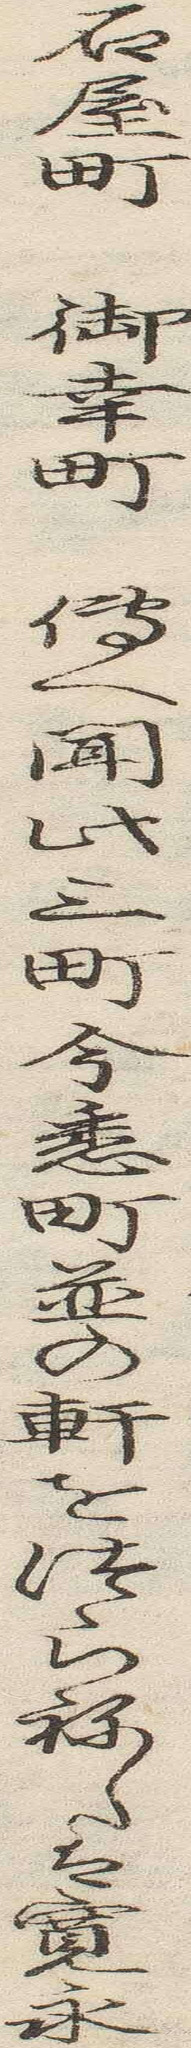石屋町御幸町傳へ聞此三町今悉町並の軒をつらねたは寛永
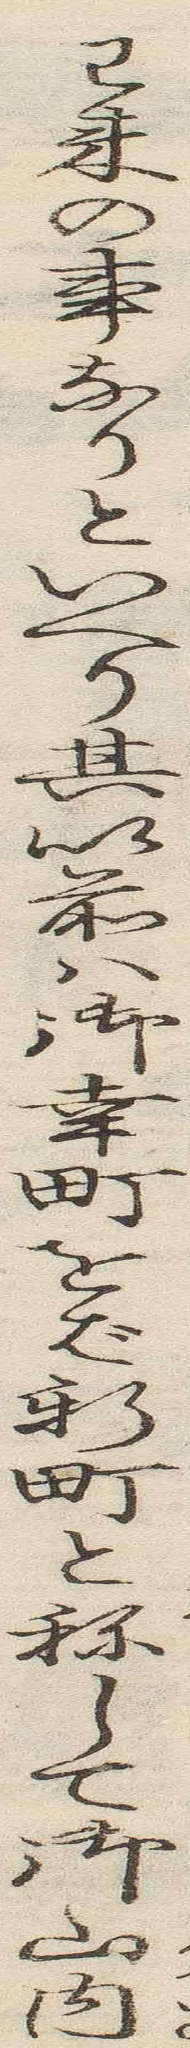已来の事なりといへり其以前は御幸町をば新町と称して御山内
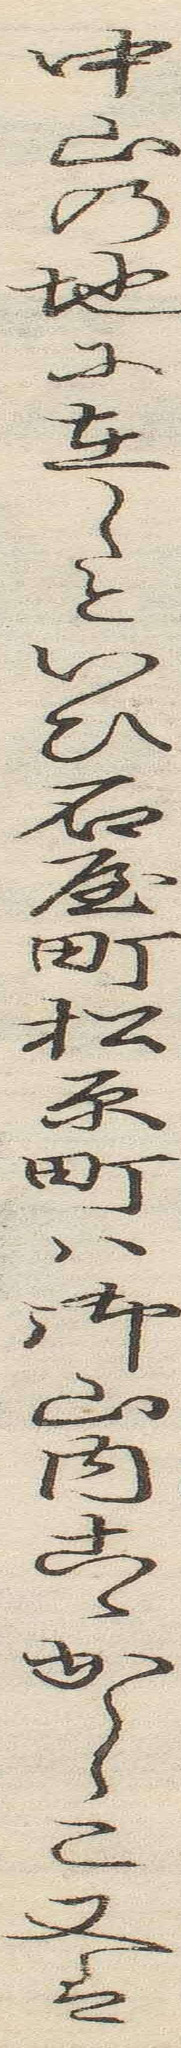中山の地に在しといひ石屋町松原町は御山内こゝかしこ又は
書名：日光山志
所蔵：東京学芸大学附属図書館 国文学研究資料館
